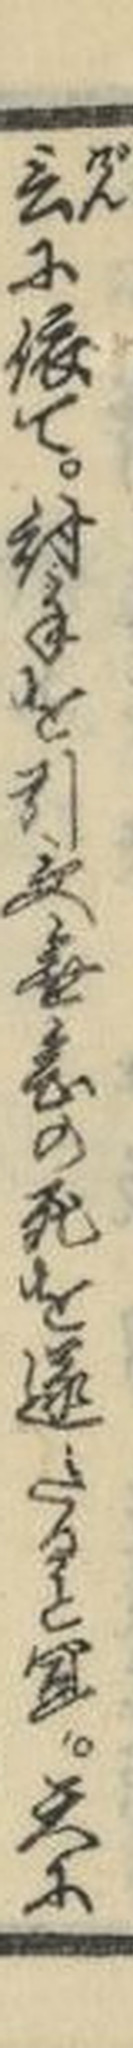言に依て。討手を引無念の死を遂たると聞。天に
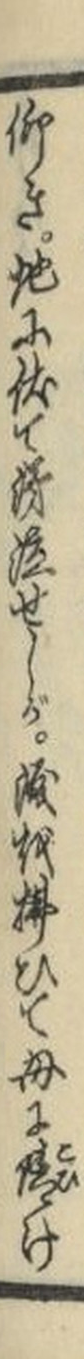仰き。地に伏て涕泣せしが。を払ひて母に請け
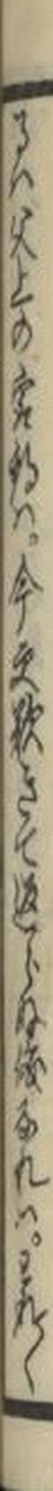るは父上のは。今更歎きて返らぬなれは。われ〳〵
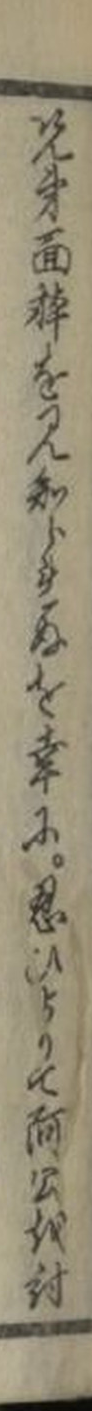兄弟面躰を見知られぬを幸に。忍ひよりて阿公を討
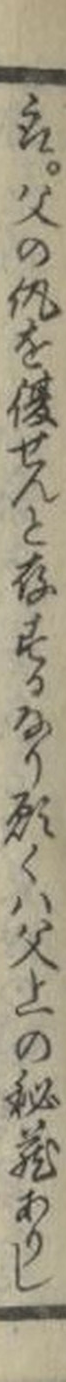取。父の仇を復せんと存するなり願くは父上の秘蔵ありし
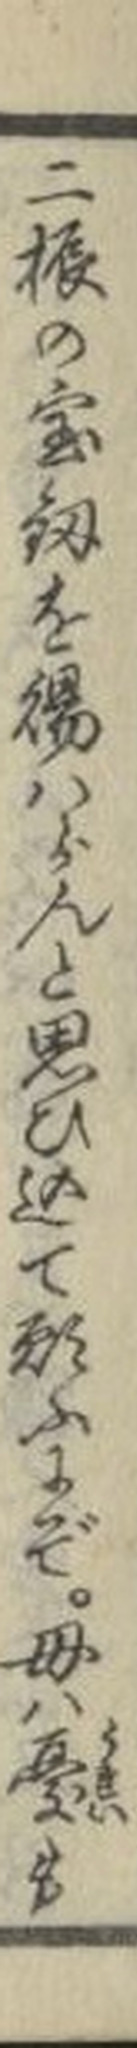二振の宝剣を賜はらんと思ひ込て願ふるぞ。母は憂も
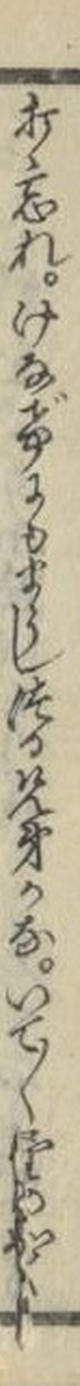打忘れ。けなげにもまうしつる兄弟かな。いて〳〵望の如く
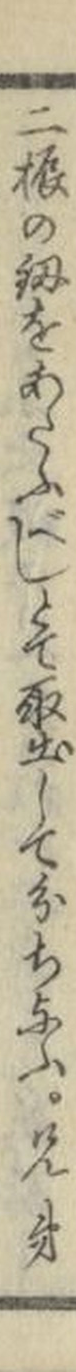二振の剣をあたふべしとて取出して分ち与ふ。兄弟
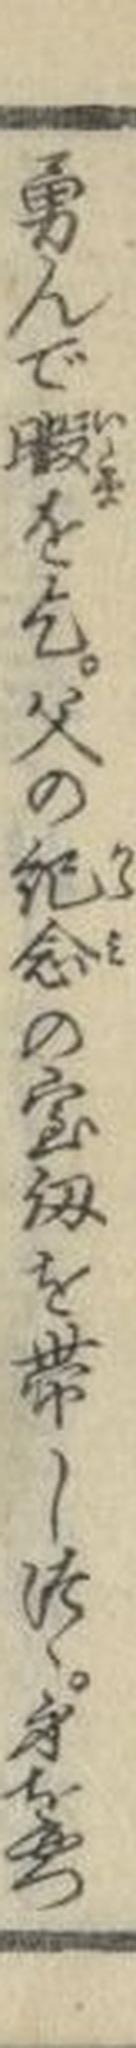勇んで暇を乞。父の紀念の宝剣を帯しつゝ。身をやつ
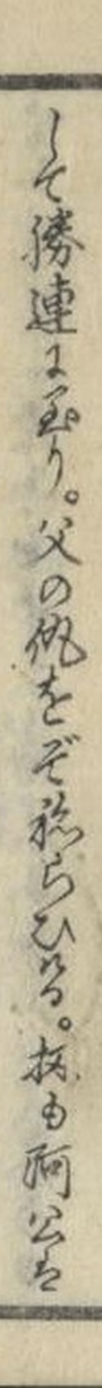して勝連に至り。父の仇をぞねらひける。扨も阿公は
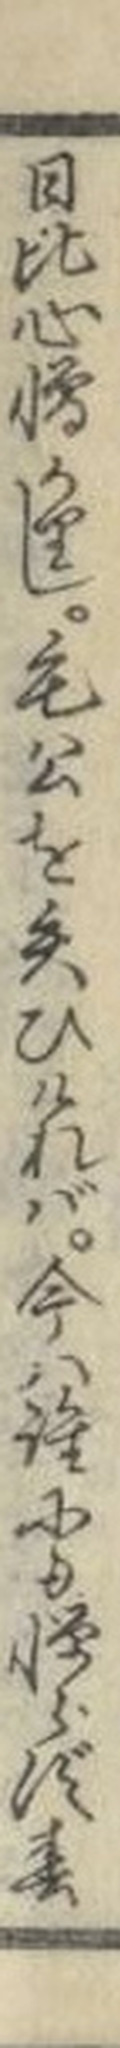日比心憎かりし。毛公を失ひければ。今は誰にも憚らず春
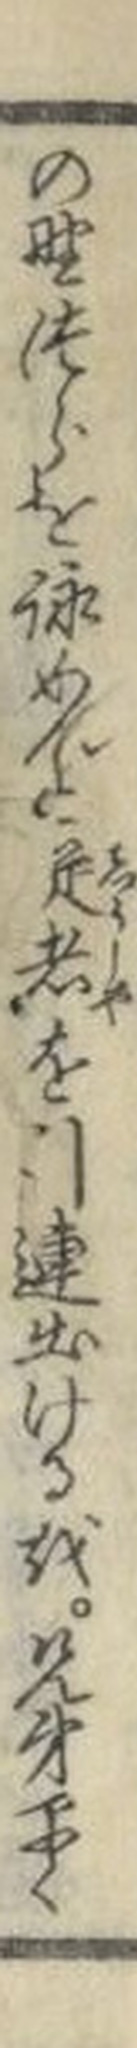の野つらを詠めんと従者を引連出けるを。兄弟早く
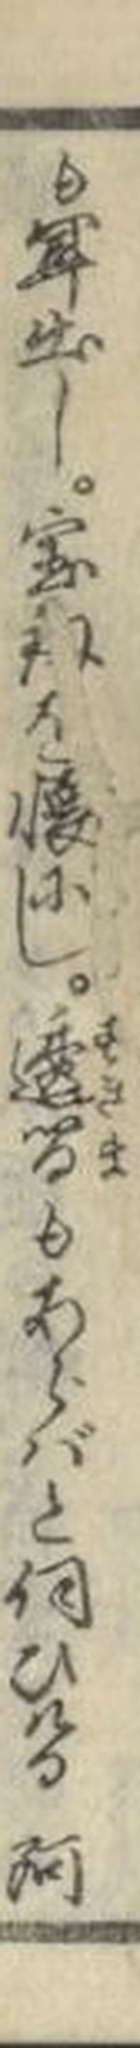も聞出し。宝剣を懐にし。透間もあらばと伺ひける阿
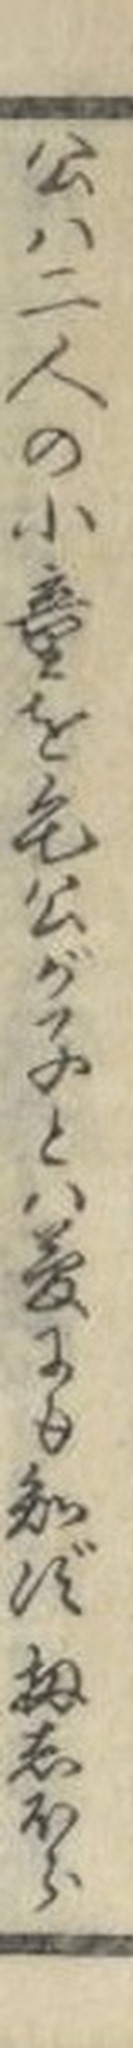公は二人の小童を毛公が子とは夢にも知ず扨しほら
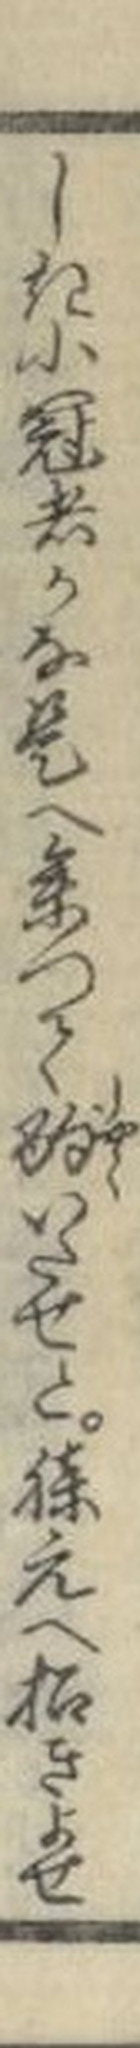しき小冠者かな是へ参つて酌いたせと。膝元へ招きよせ
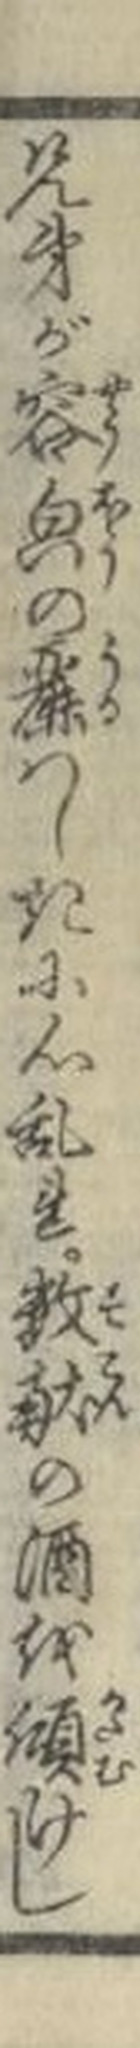兄弟が容皃の麗はしきに心乱れ。数献の酒を傾けし
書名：琉球解語
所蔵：University of the Ryukyus Library
